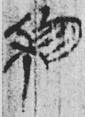利
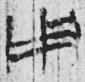用
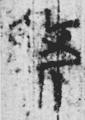祭
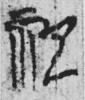祀
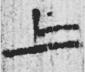上
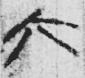六
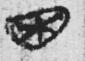困
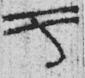于
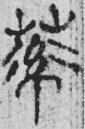{艸率}（葛）
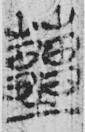○（藟）
